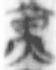黃
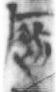所
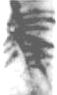馭（御）
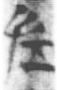○（左）
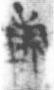○（旆）
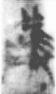雘
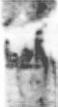輪
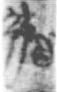弼
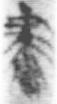○（畫）
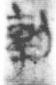韌
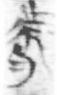○（虎）
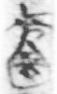○（韔）
